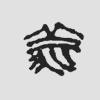羕
